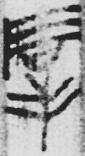厚
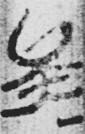矣
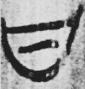甘
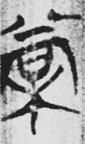棠
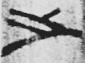之
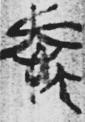○（愛）
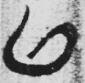㠯（以）
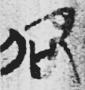○（召）
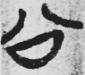公
